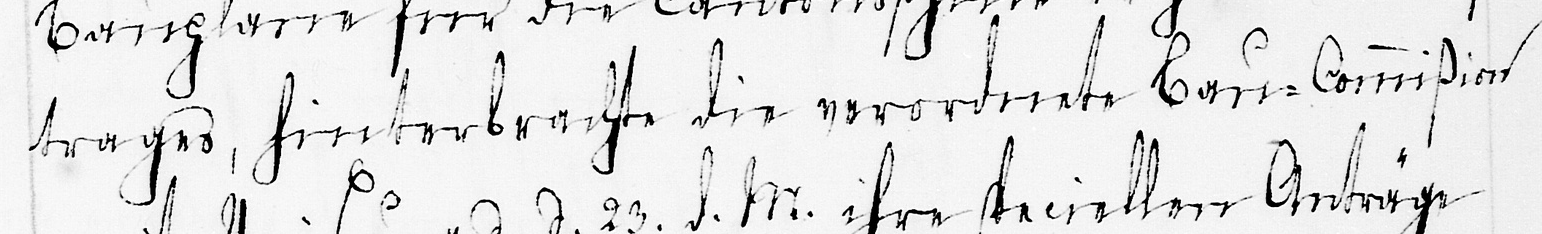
trages, hinterbrachte die verordnete Bau-Commißion
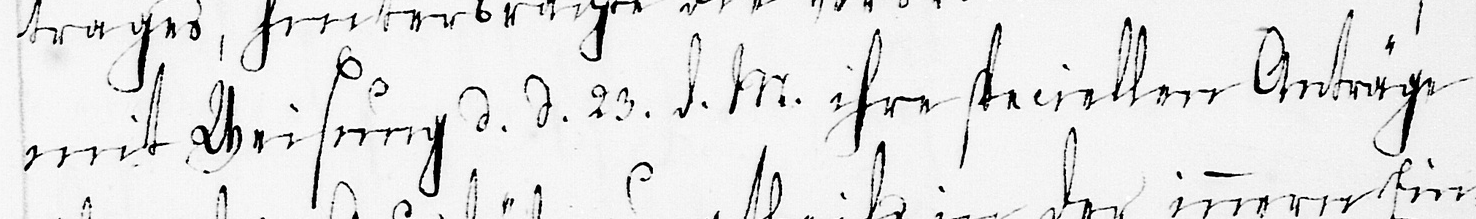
mit Weisung d. d. 23. d. M. ihre speciellen Anträge
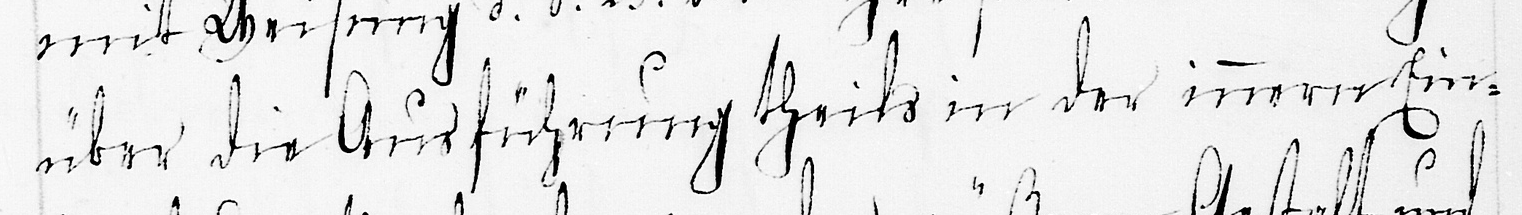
über die Ausführung theils in der innern Ein¬
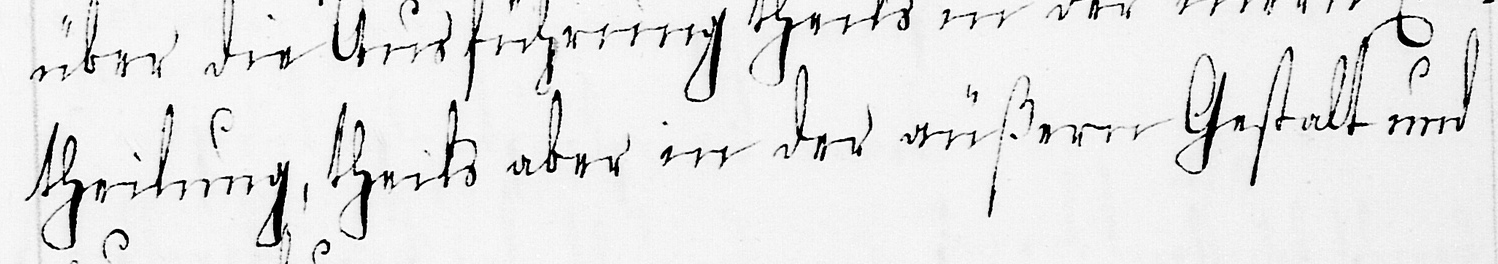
theilung, theils aber in der äußern Gestalt und
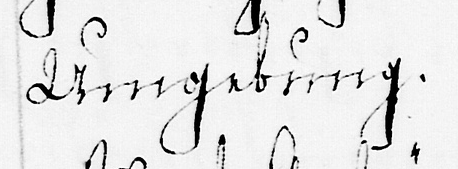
Umgebung.
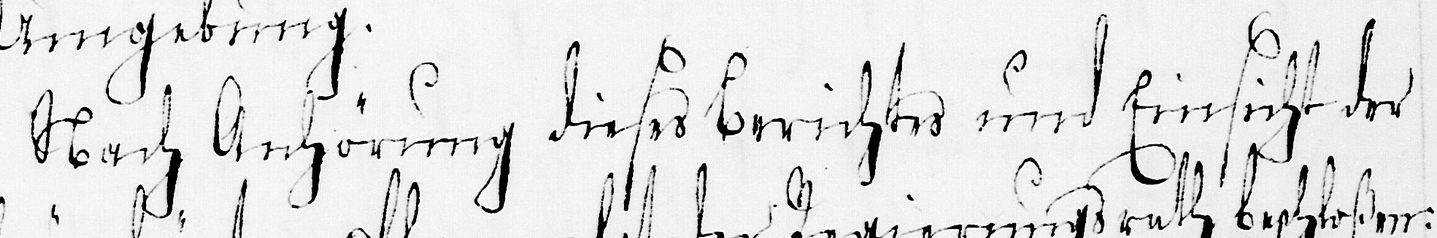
Nach Anhörung dieses Berichtes und Einsicht der
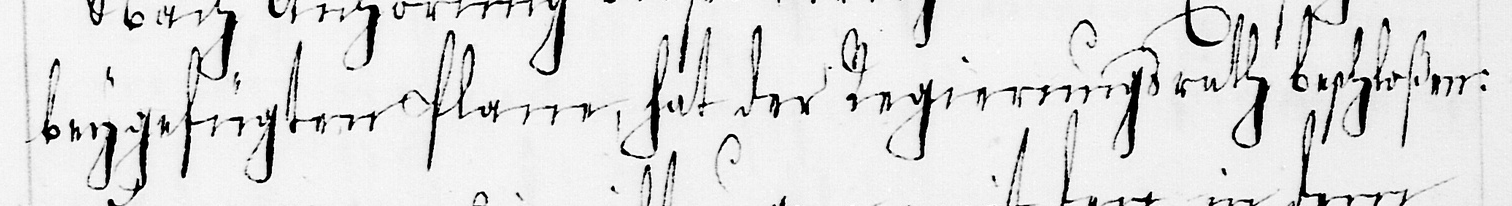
beygefügten Plane, hat der Regierungsrath beschloßen:
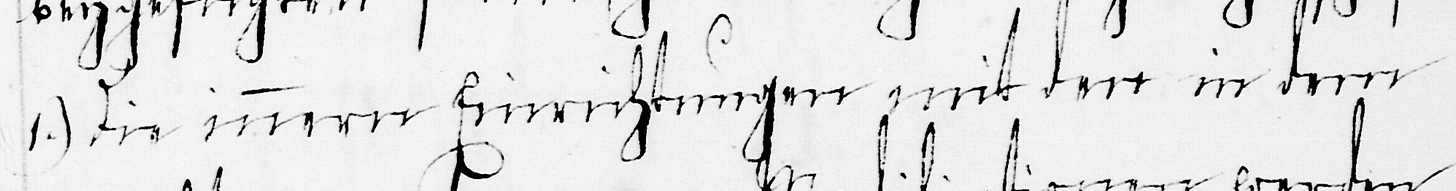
1.) Die innern Einrichtungen mit den in dem
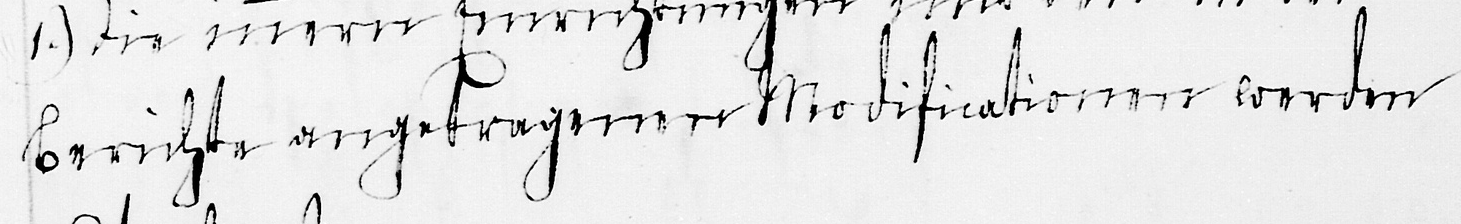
Berichte angetragenen Modificationen werden
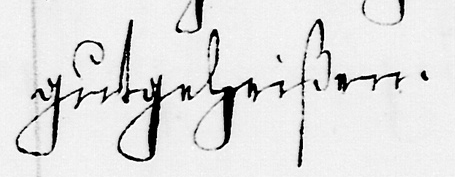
gutgeheißen.
